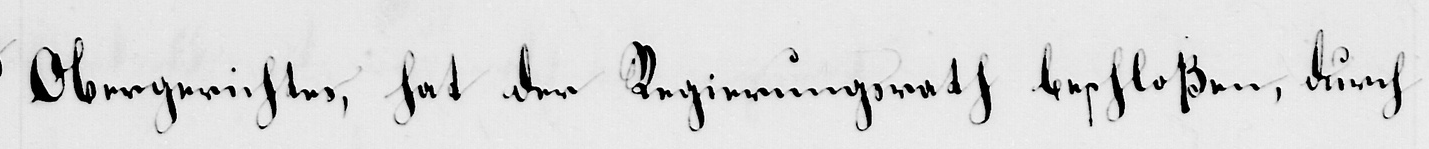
Obergerichtes, hat der Regierungsrath beschloßen, durch
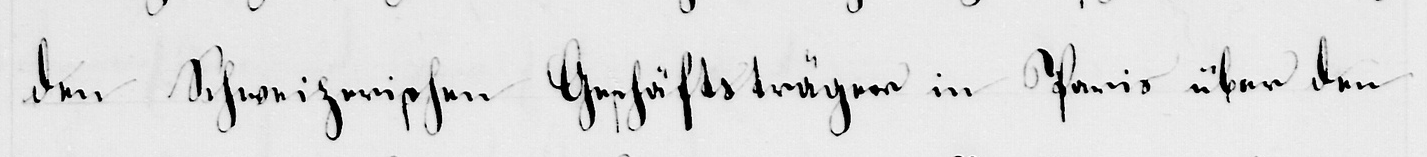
den Schweizerischen Geschäftsträger in Paris über den
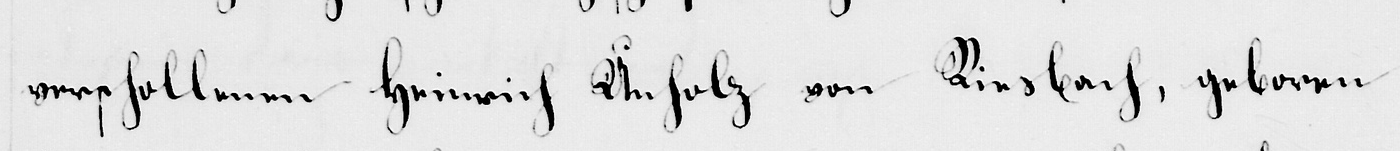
verschollenen Heinrich Unholz von Riesbach, geboren
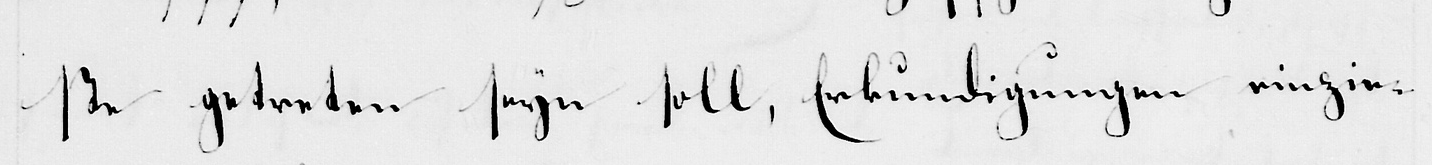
ste getreten seyn soll, Erkundigungen einzie¬
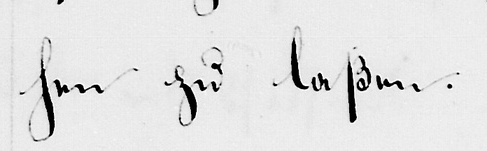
hen zu laßen.
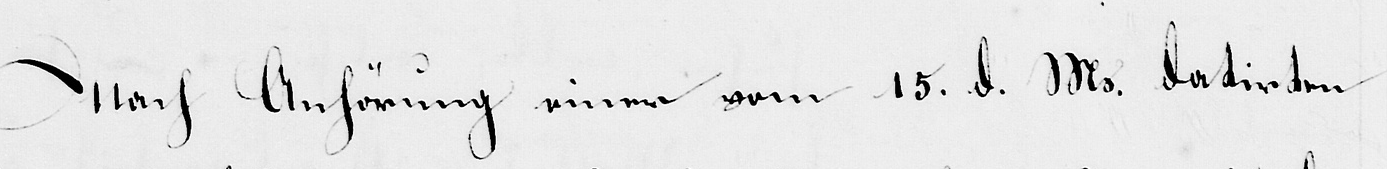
Nach Anhörung einer vom 15. d. Ms. datirten
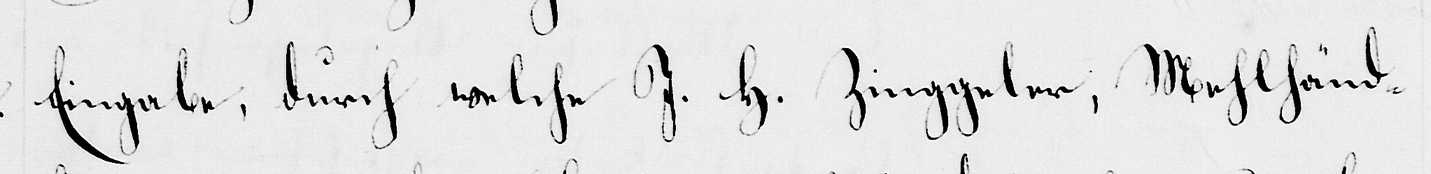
Eingabe, durch welche J. H. Zinggeler, Mehlhänd¬
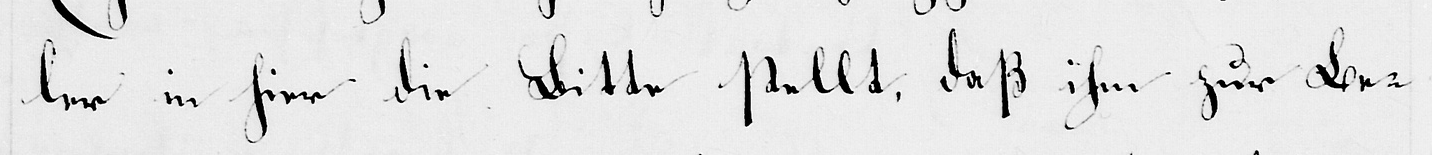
ler in hier die Bitte stellt, daß ihm zur Be¬
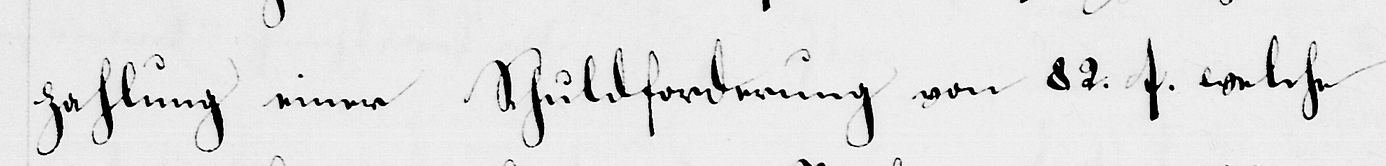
zahlung einer Schuldforderung von 82. F. welche
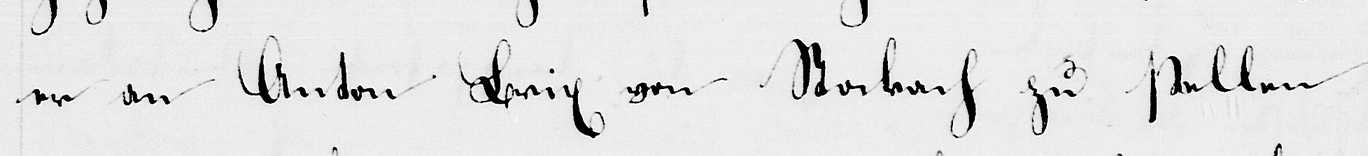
er an Anton Brix von Stockach zu stellen
